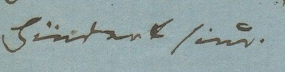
hindert sind.
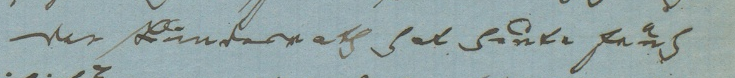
Der Bundesrath hat heute früh
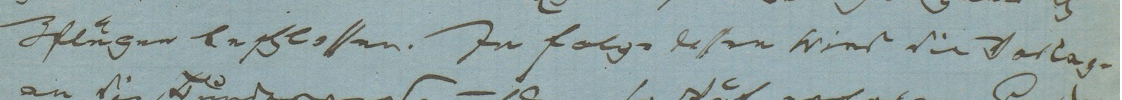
Splügen beschlossen. In Folge dessen wird die Vorlage
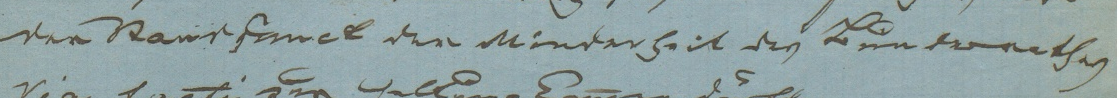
der Standpunct der Minderheit des Bundesrathes
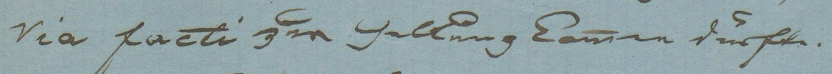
via facti zur Geltung kommen dürfte.
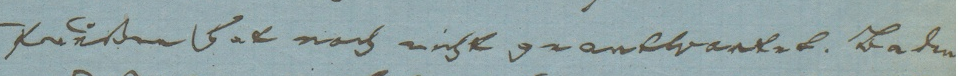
Preußen hat noch nicht geantwortet. Baden
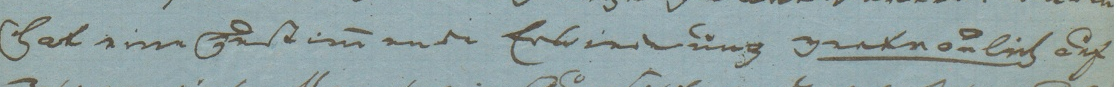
hat eine zustimmende Erwiederung vertraulich auf
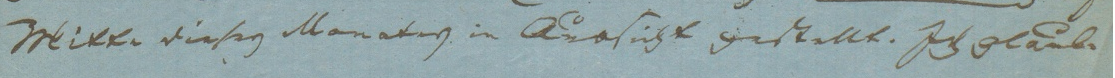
Mitte dieses Monates in Aussicht gestellt. Ich glaube
